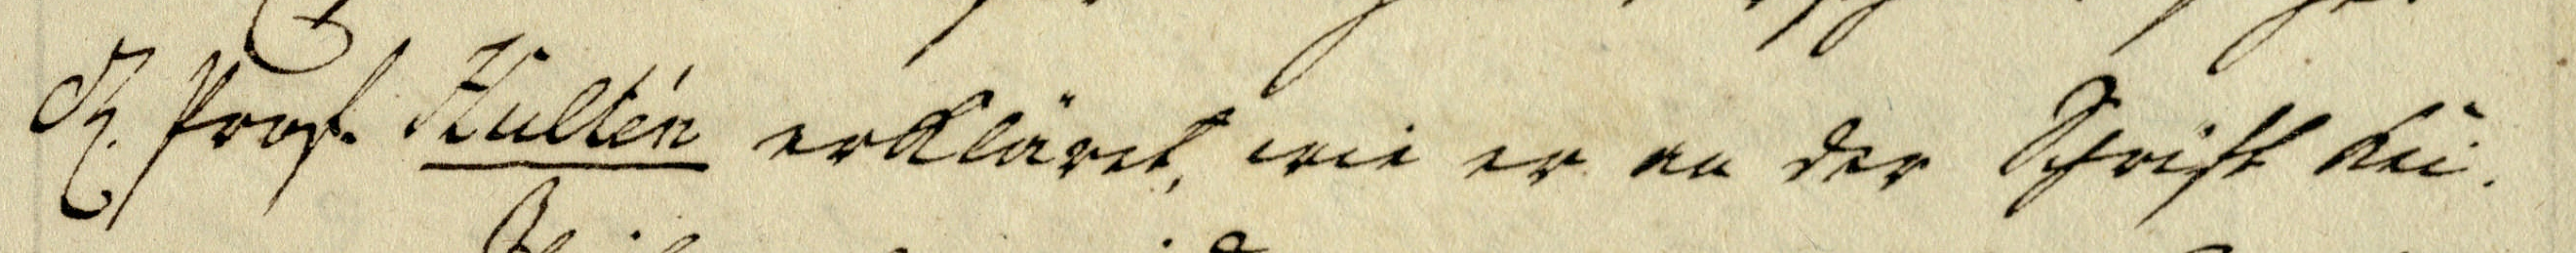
dh. Prof. Hultén erkläret, wie er an der Schrift kei¬
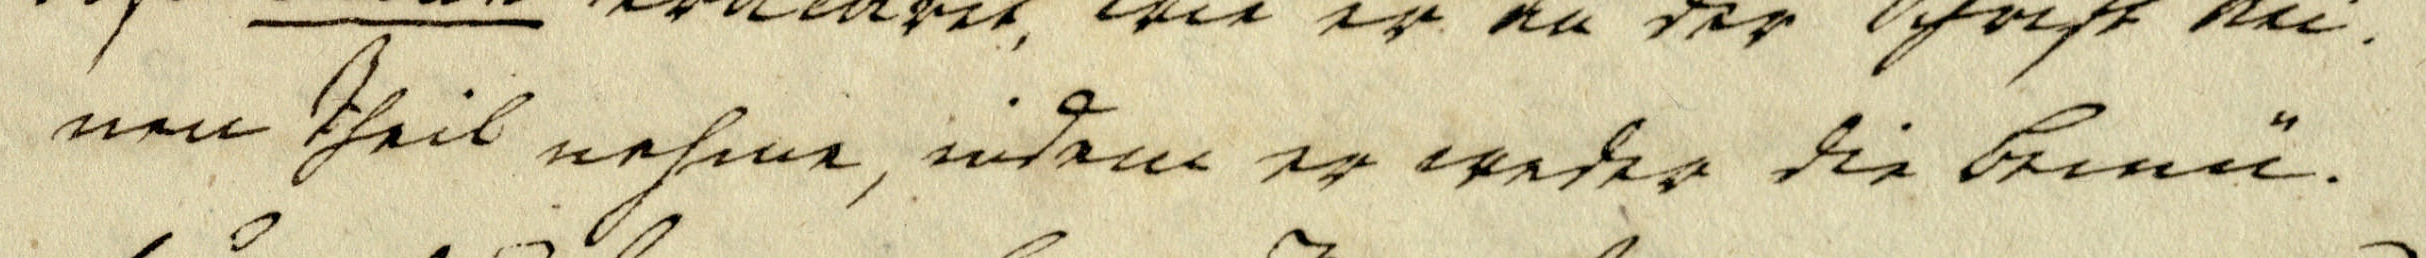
nen Theil nehme, indem er weder die Bemü¬
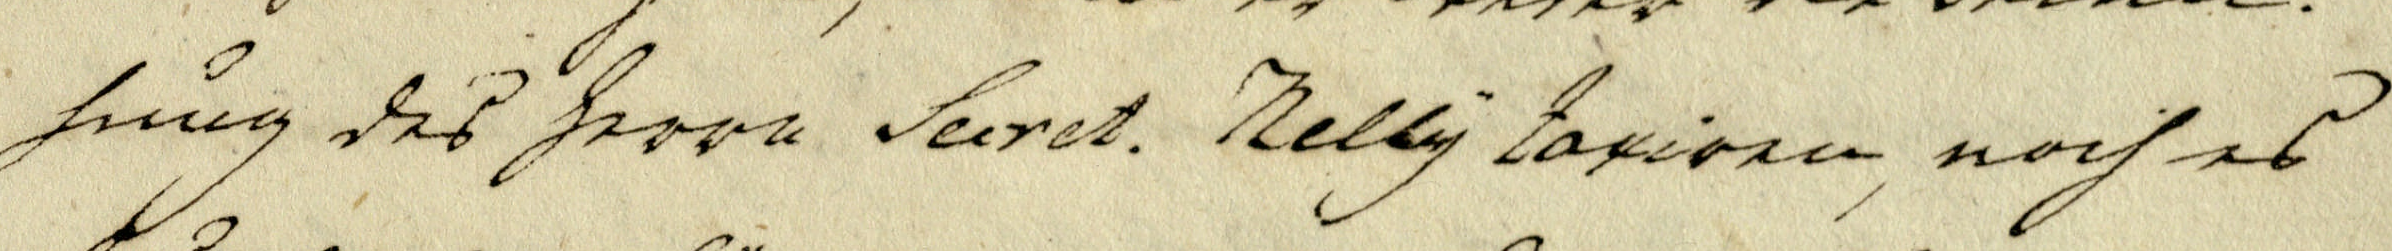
hung des Herrn Secret. Nellÿ taxiren, noch es
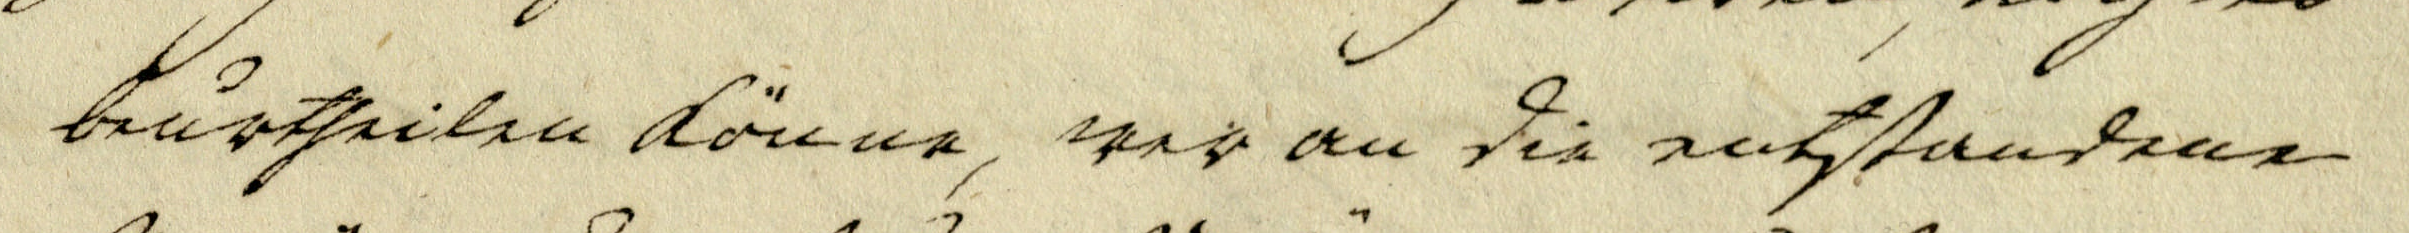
beurtheilen könne, wer an die entstandene
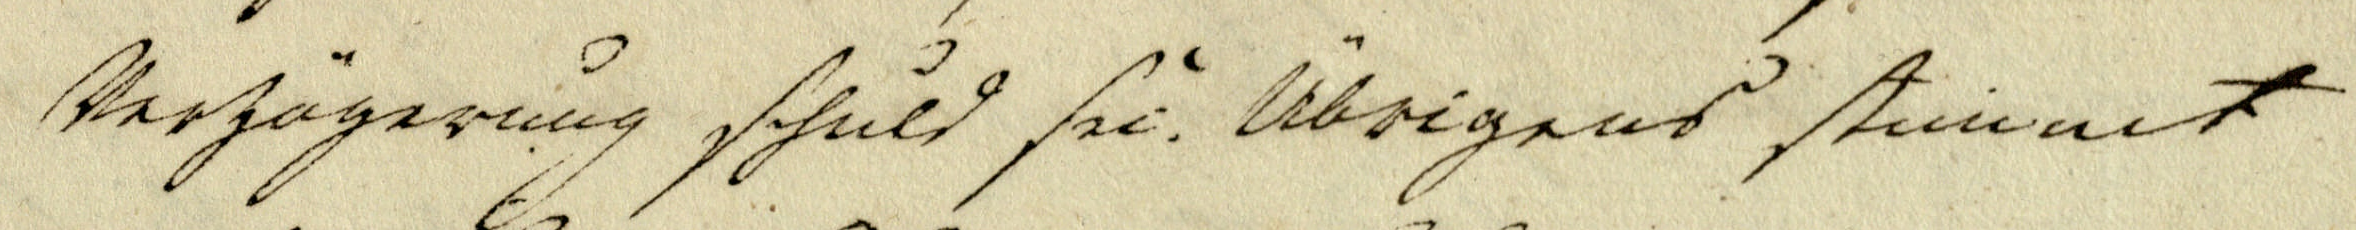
Verzögerung schuld sei. Übrigens stimmt
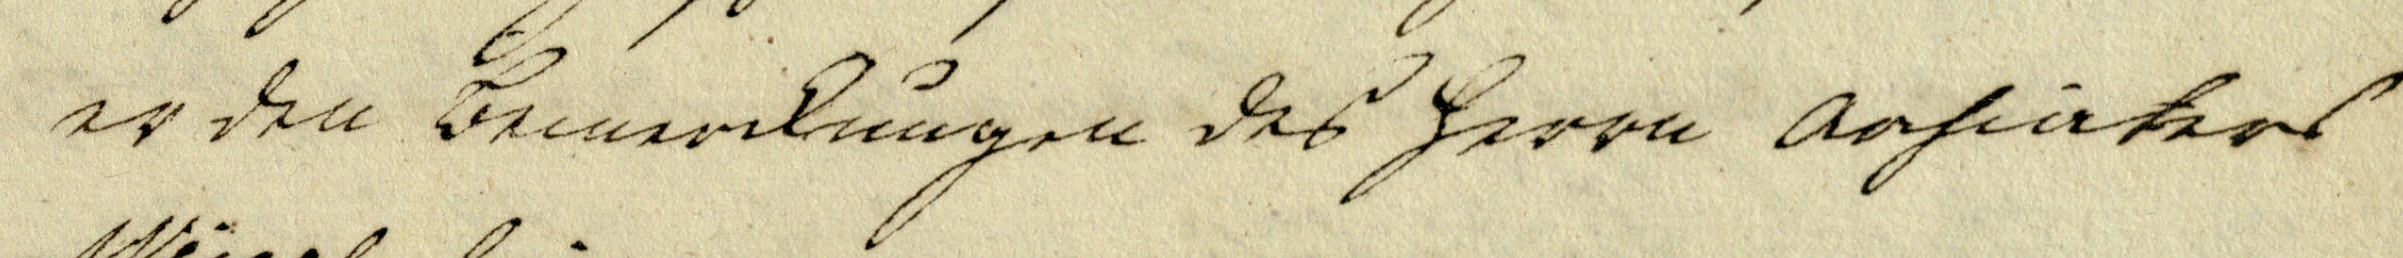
er den Bemerckungen des Herrn Archiaters
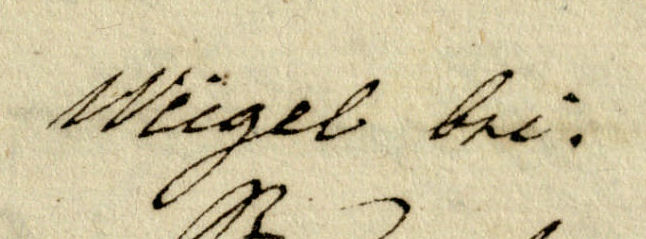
Weigel bei.
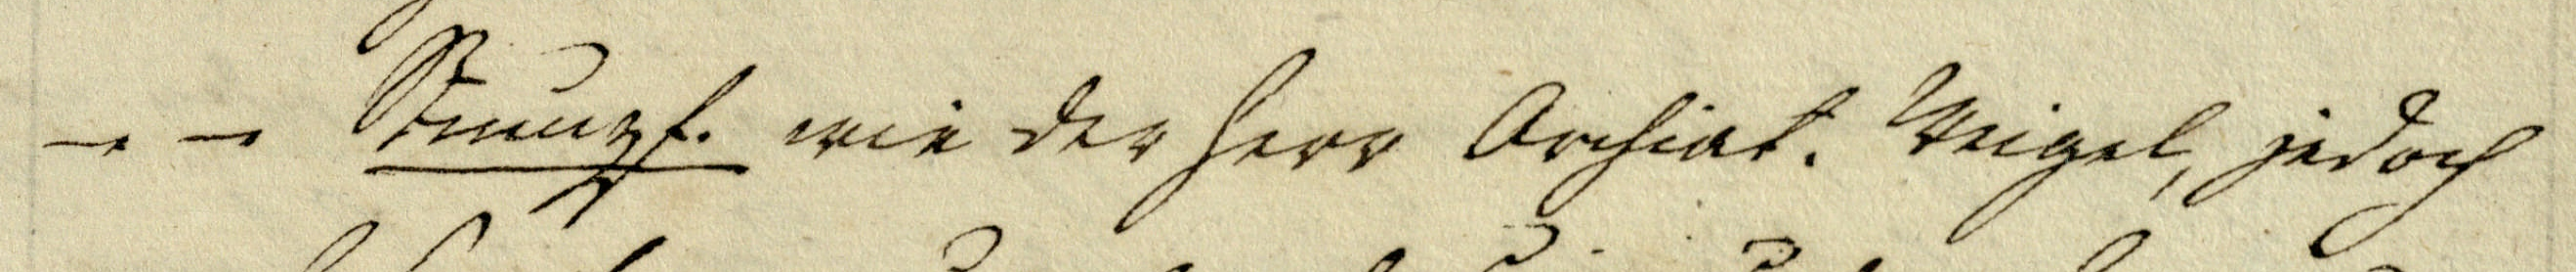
Stumpf, wie der Herr Archiat. Weigel, jedoch
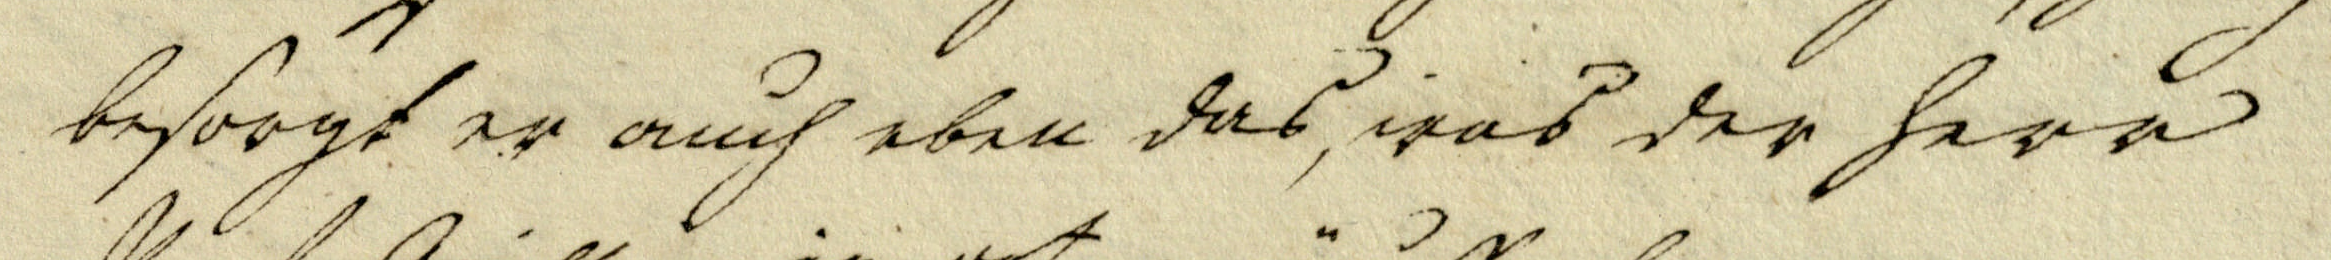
besorgt er auch eben das, was der Herr
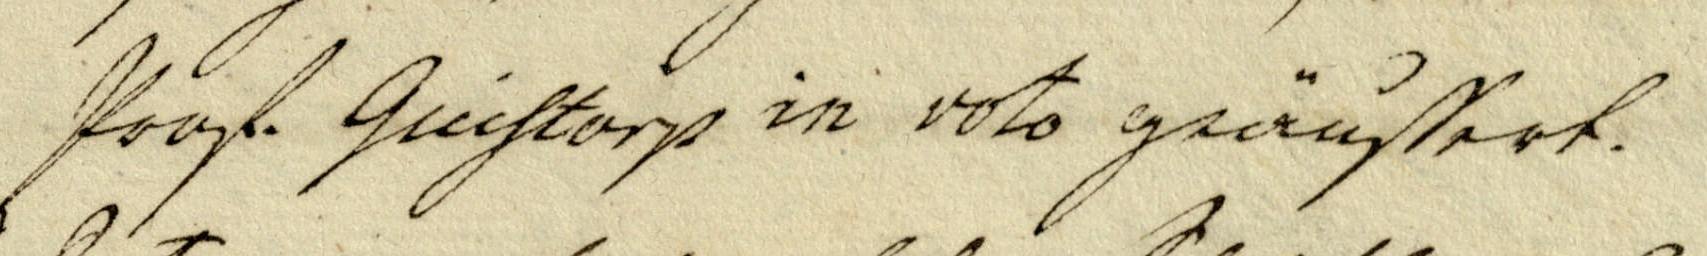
Prof. Quistorp in voto geäussert.
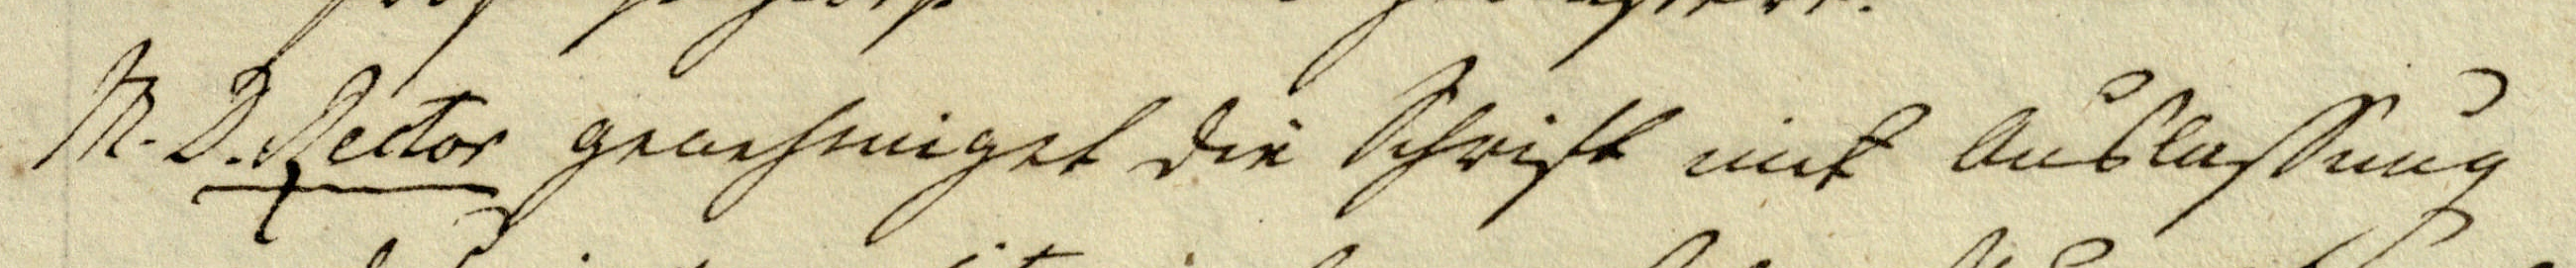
M. D. Rector genehmiget die Schrift mit Auslassung
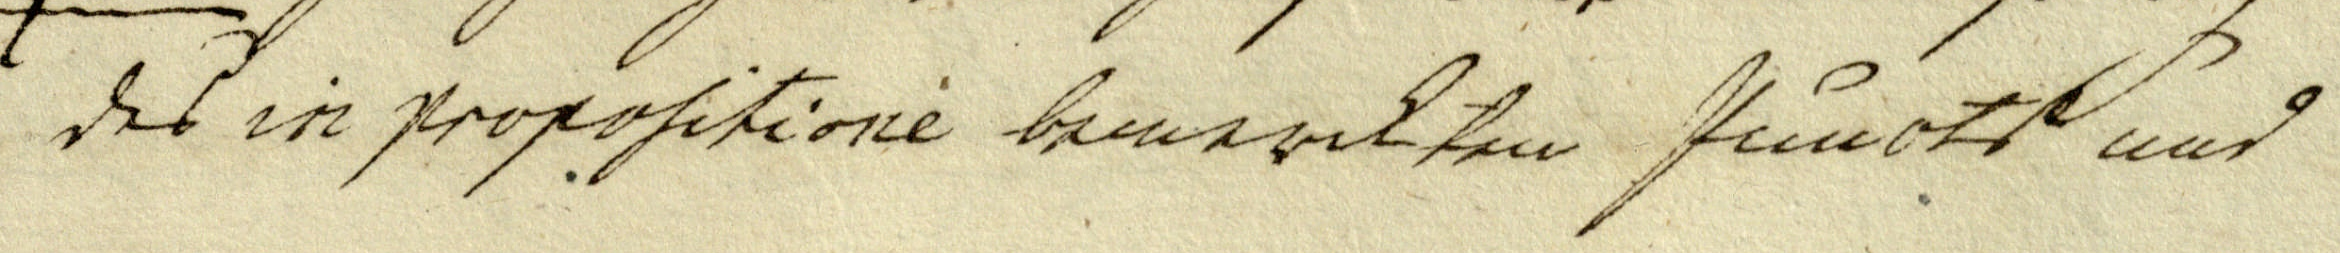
des in propositione bemerckten Puncts und
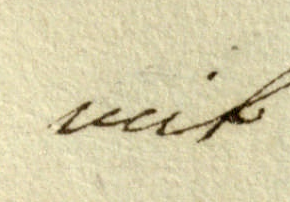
mit
